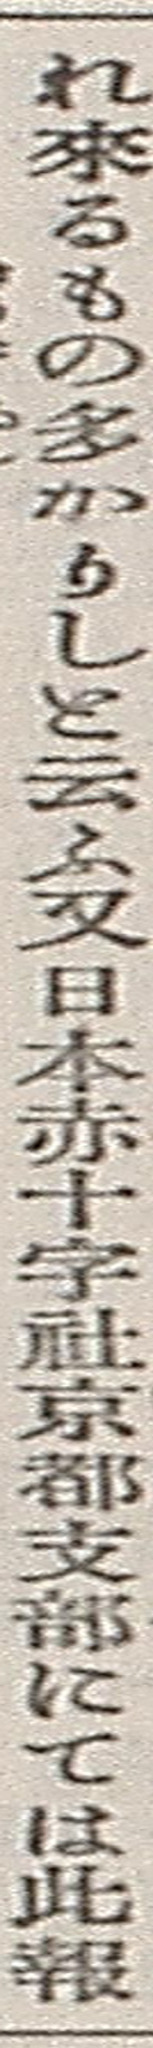れ来るもの多かりしと言ふ亦日本赤十字社京都支部にて此報
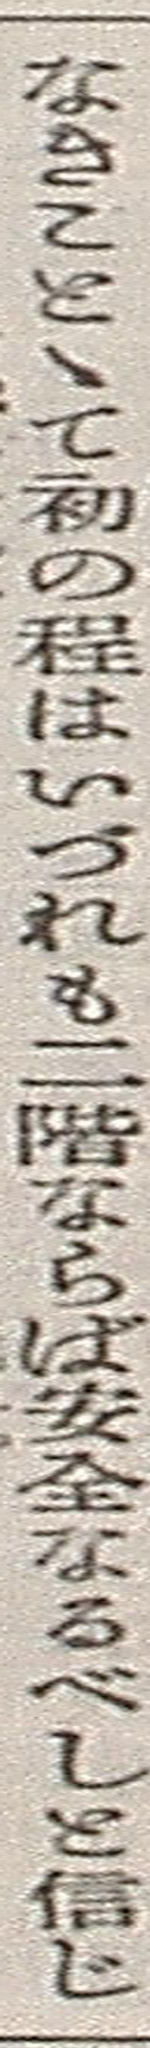なきことゝて初の程はいづれも二階ならば安全なるべしと信じ
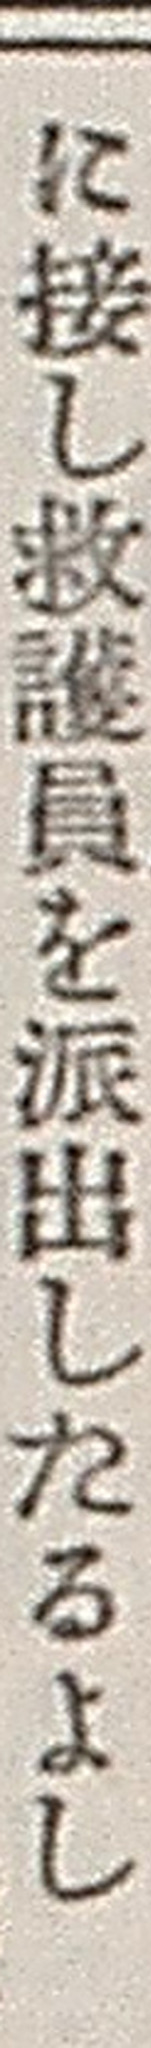に接し救護員を派出したるよし
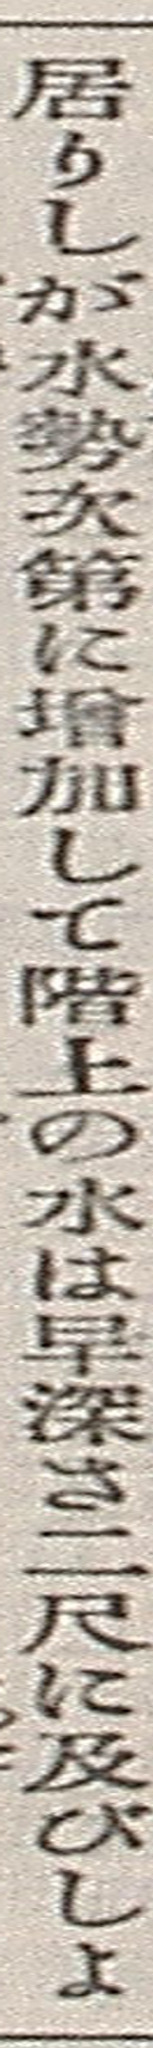居りしが水勢次第に増加して階上の水は早深さ二尺に及びしよ
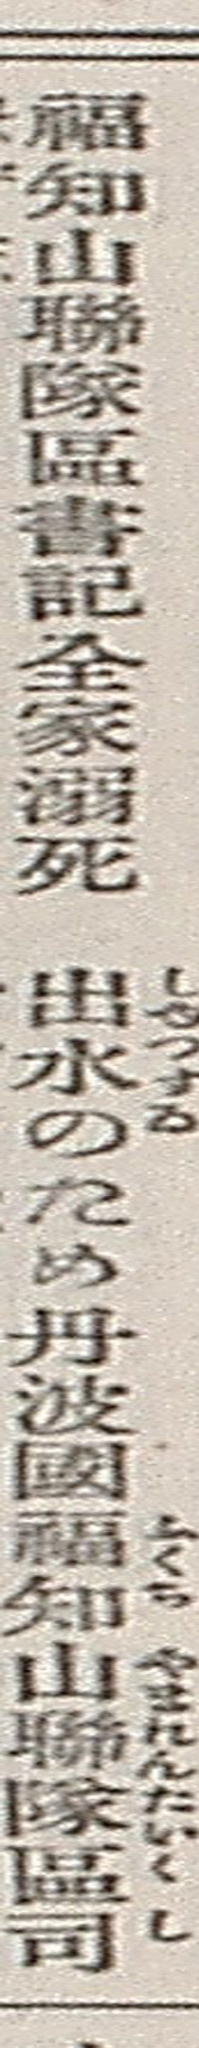福知山聯隊區書記全家溺死出水のため丹波国福知山聯隊區司
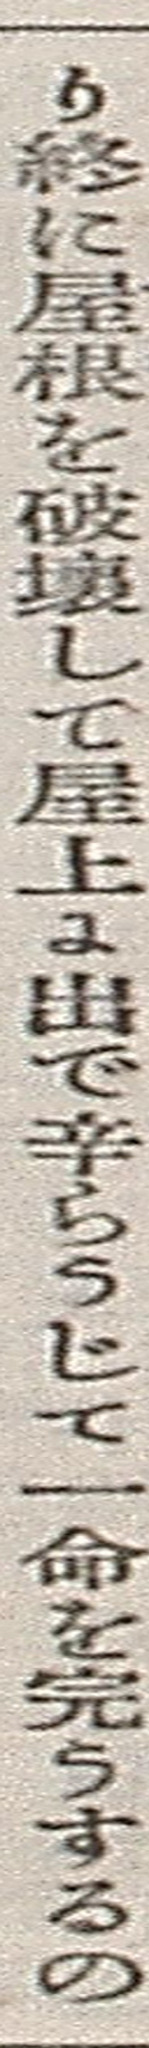り終に屋根を破壊して屋上に出で辛らうじて一命を完うするの
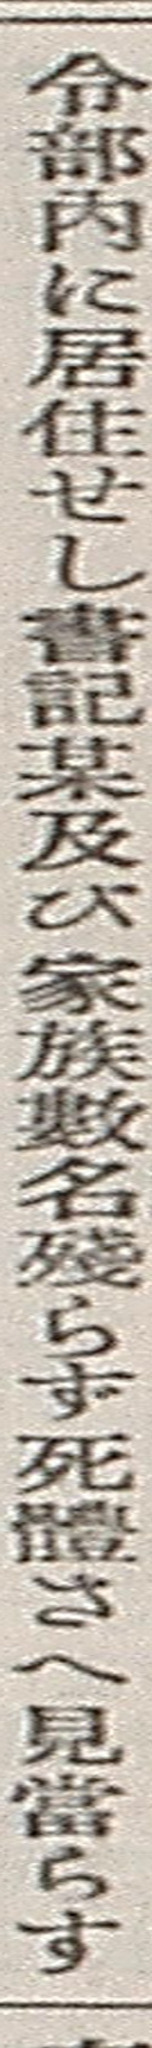令部内に居住せし書記某及び家族数名䙁らず死体さへ見当らず
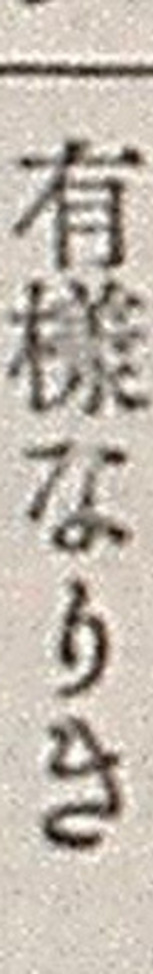有様なりき
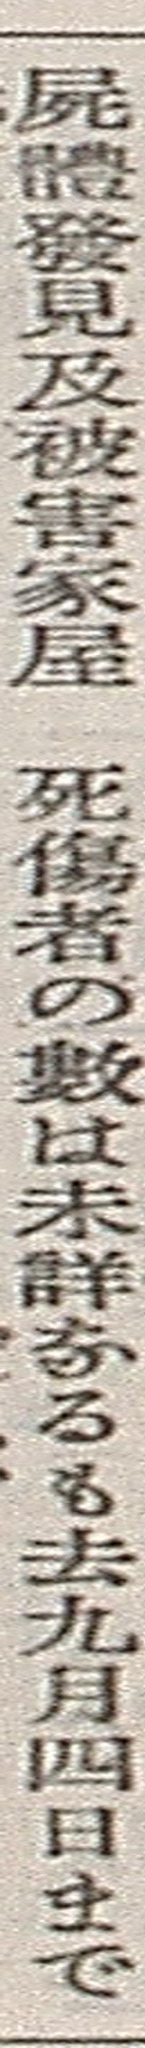屍体発見及被害家屋死傷者の数は未詳なるも去九月四日迄
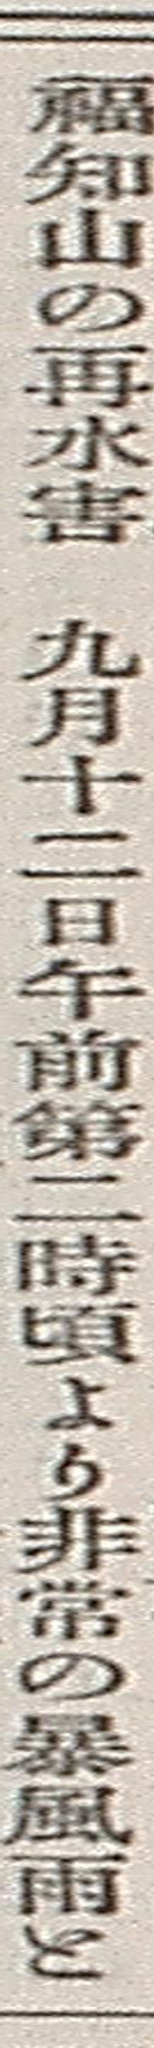福知山の再水害九月十二日午前第二時頃より非常の豪風雨と
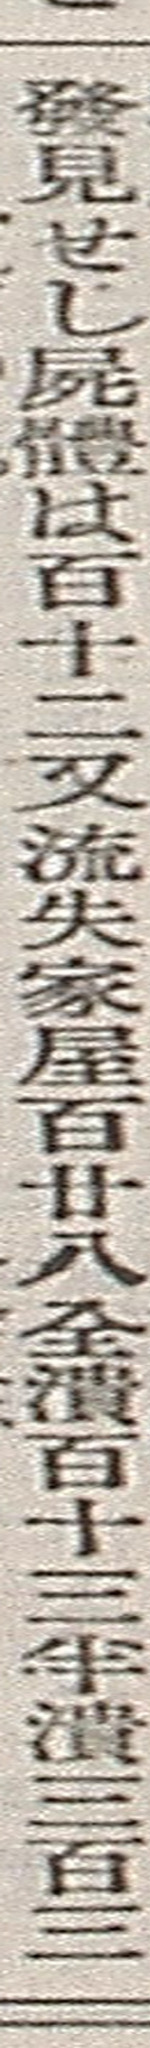発見せし屍体は百十二亦流失家屋百廿八全潰百十三半潰三百三
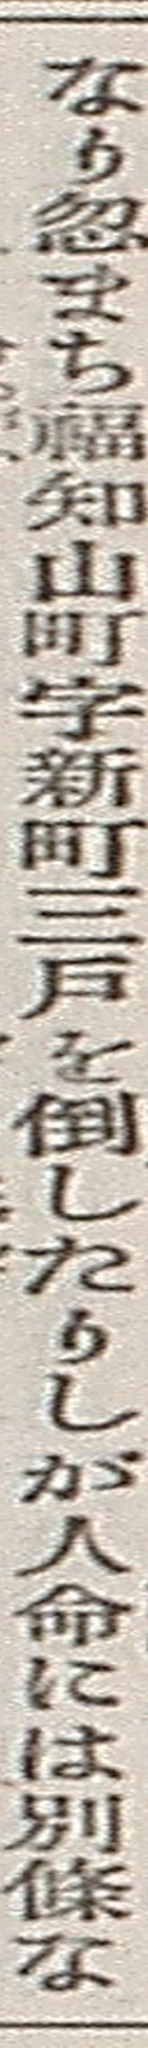なり忽まち福知山字新町三戸を倒したりしが人命には別条な
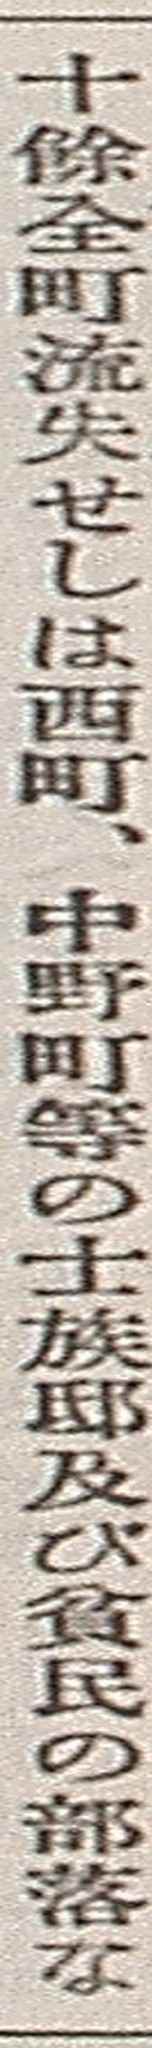十餘全町流失せしは西町、中野町等の士族邸及び貧民の部落な
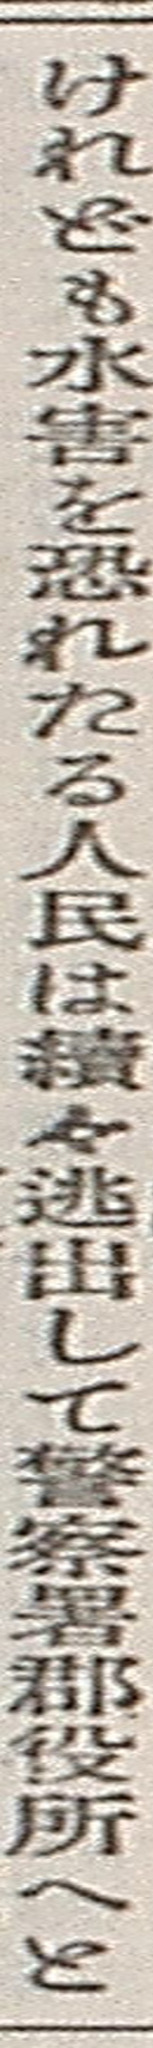けれども水害を恐れたる人民は続々逃出して警察署郡役所へと
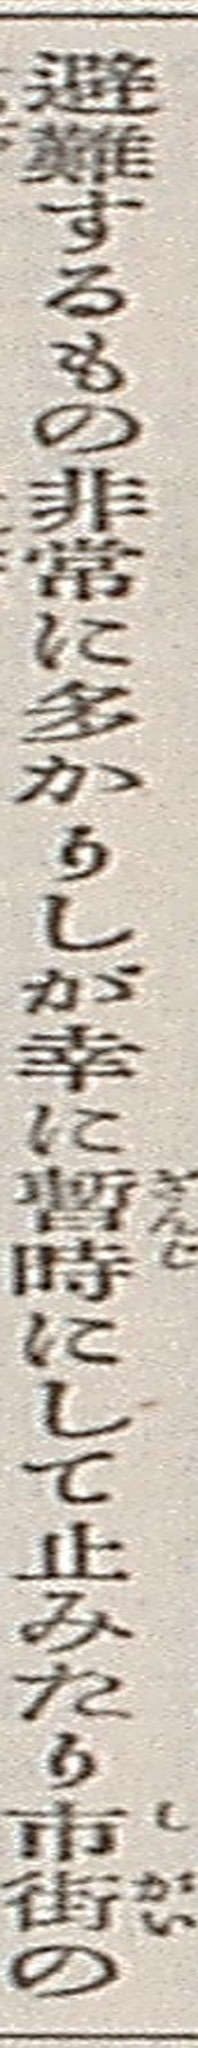避難するもの非常に多かりしが幸に暫時にして止みたり市街の
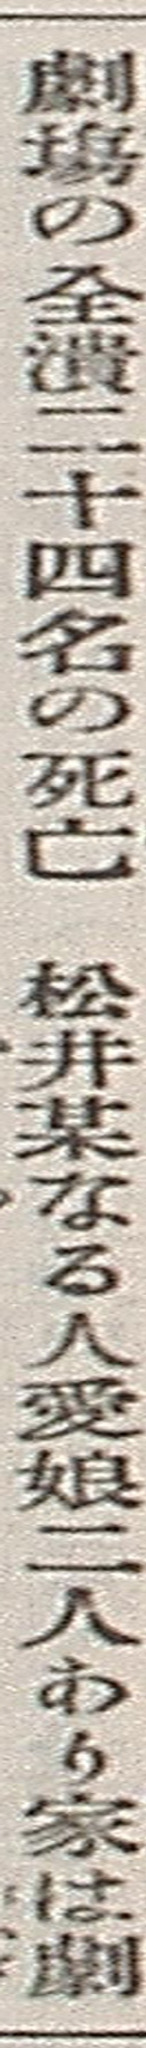劇場の全潰二十四名の死亡松井某なる人愛娘二人あり家は劇
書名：風俗畫報臨時増刊第百二十六號　洪水被害録（中）
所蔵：東京大学地震研究所図書室 Earthquake Research Institute Library, The University of Tokyo, JAPAN
